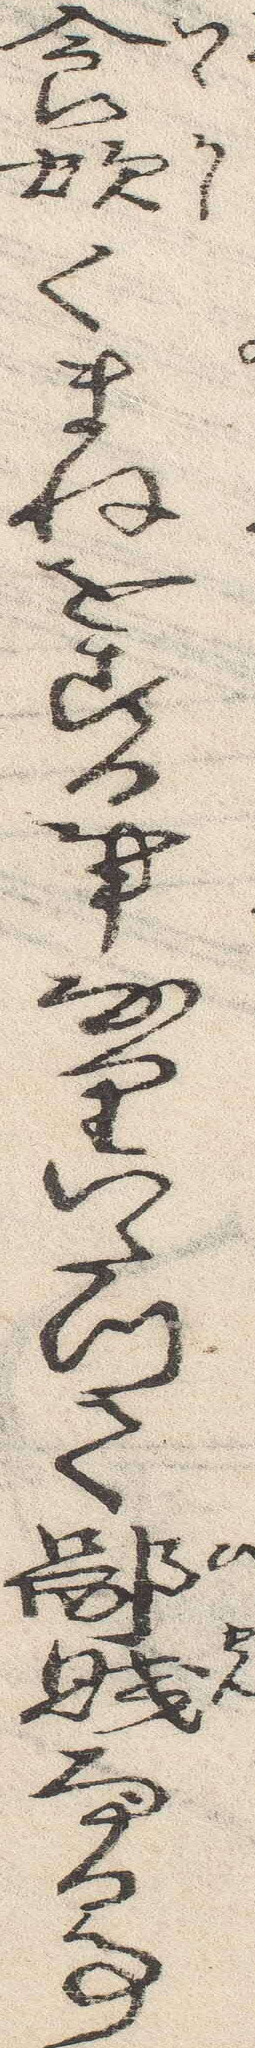食炊くまねをする事なりいたつて鄙賤なる事
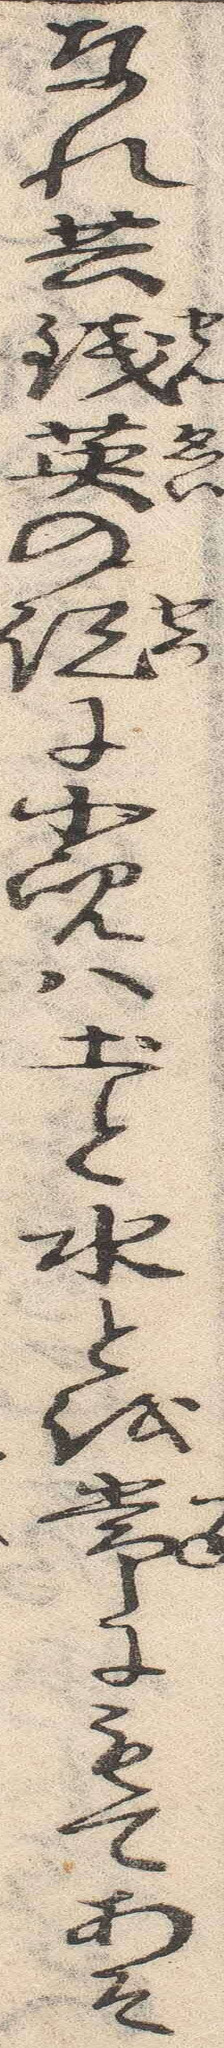なれ共銭英の説に小児は土と水とを常にもてあそ
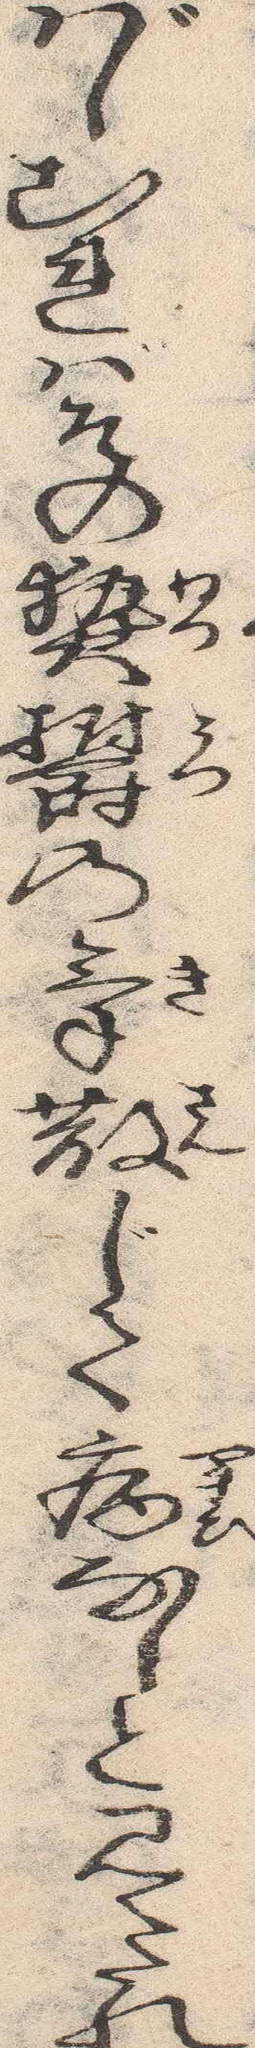ばしむればその熱鬱の気散じて病なしと見えたれ
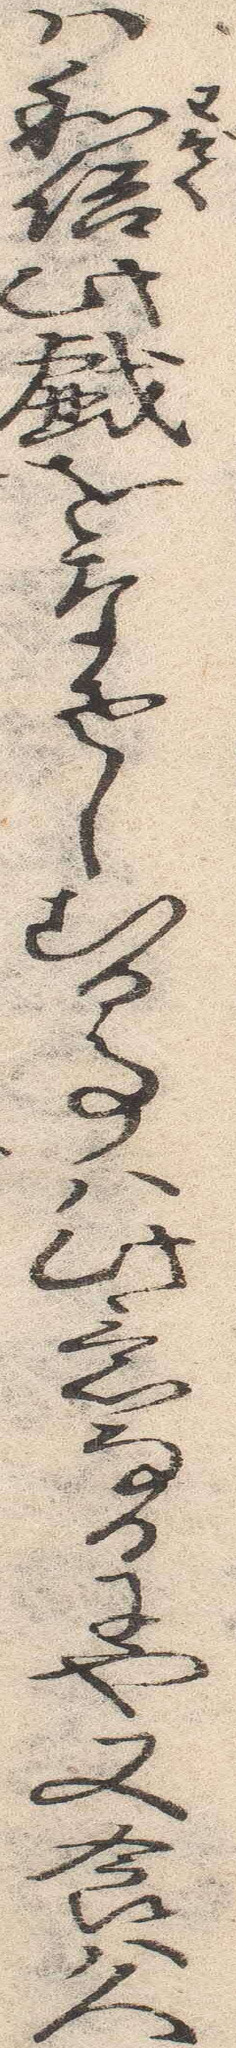は和俗此戯をなさしむる事は此意なるにや又食は人
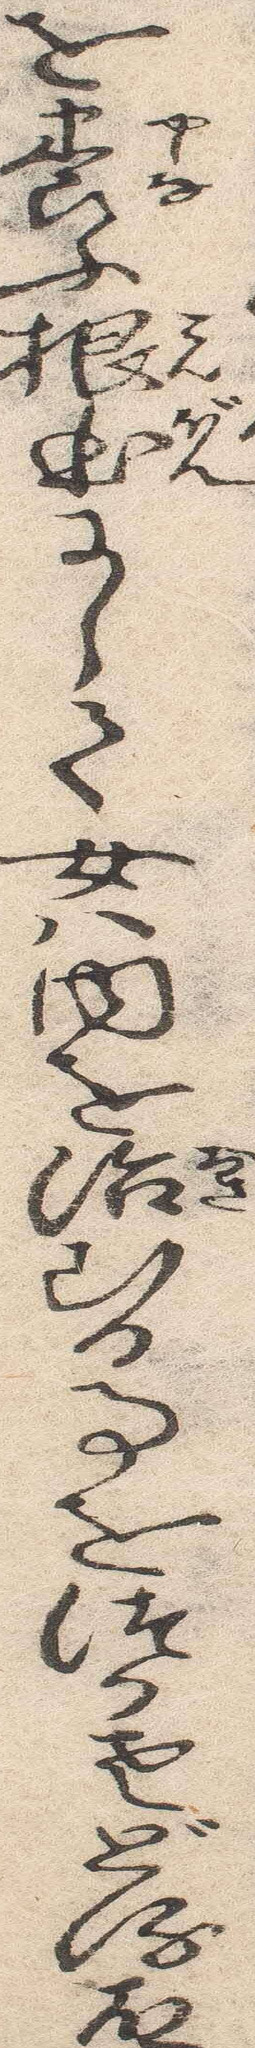を養ふ根本にして女は内を治むる事をつかさどる故
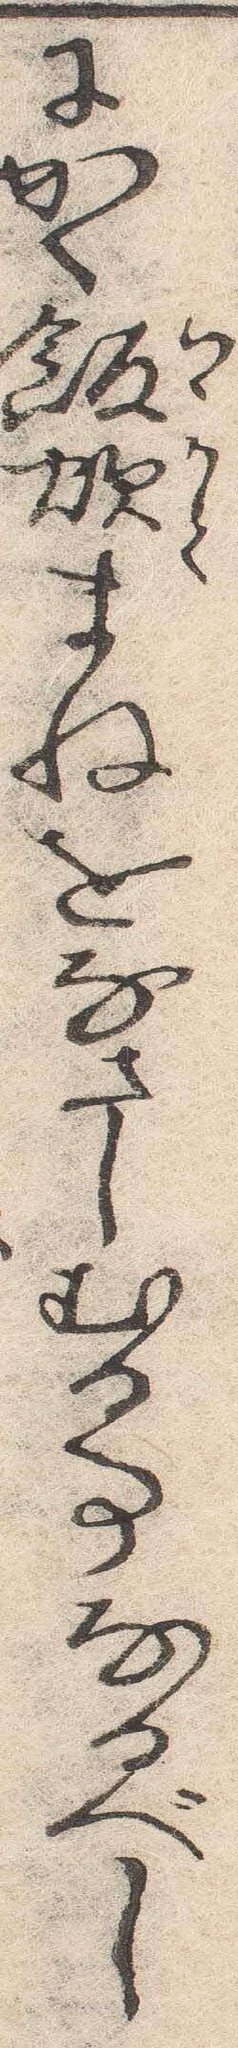にかく飯炊まねをなさしむる事なるべし
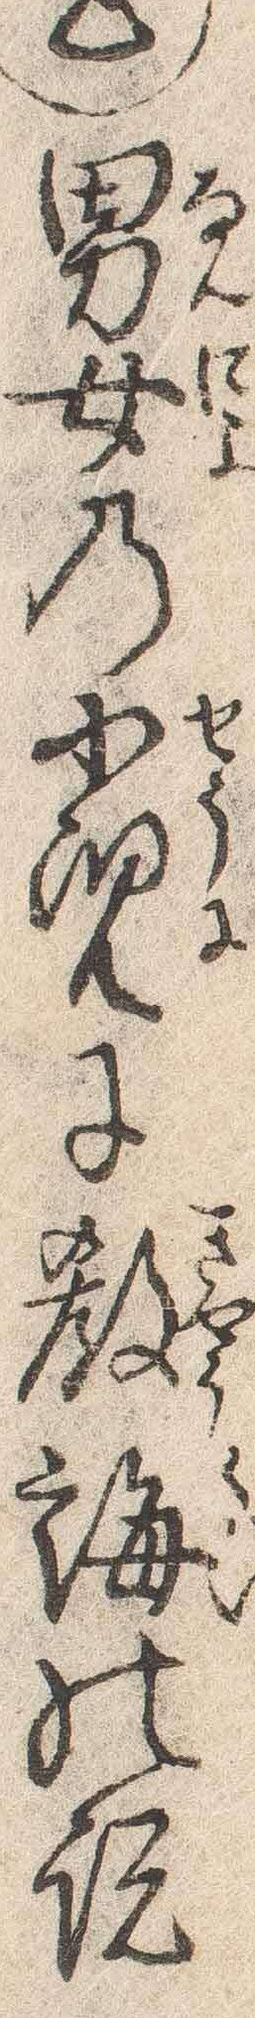㊄男女の小児に教誨の説
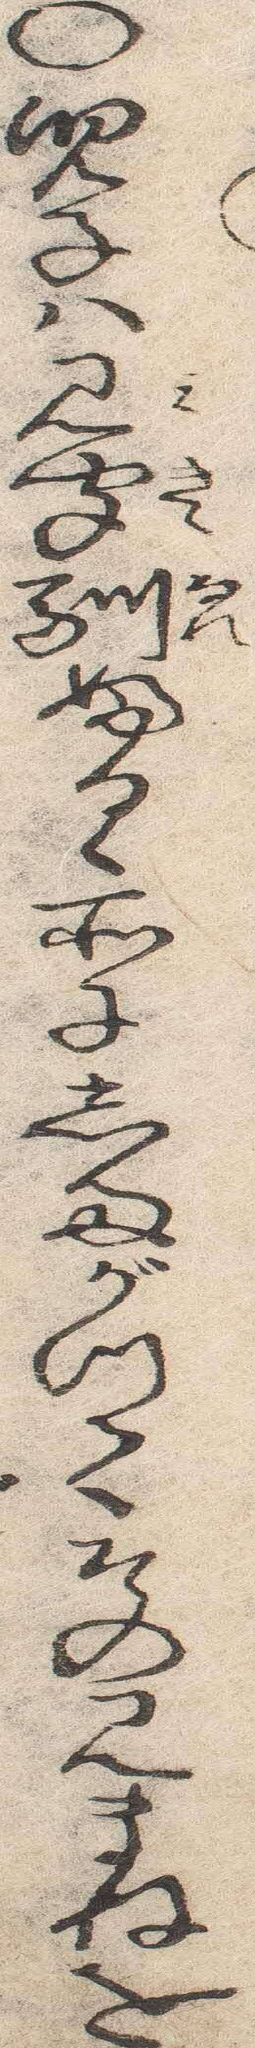○児子は見聞馴ふるゝ所にしたがつてその見まねを
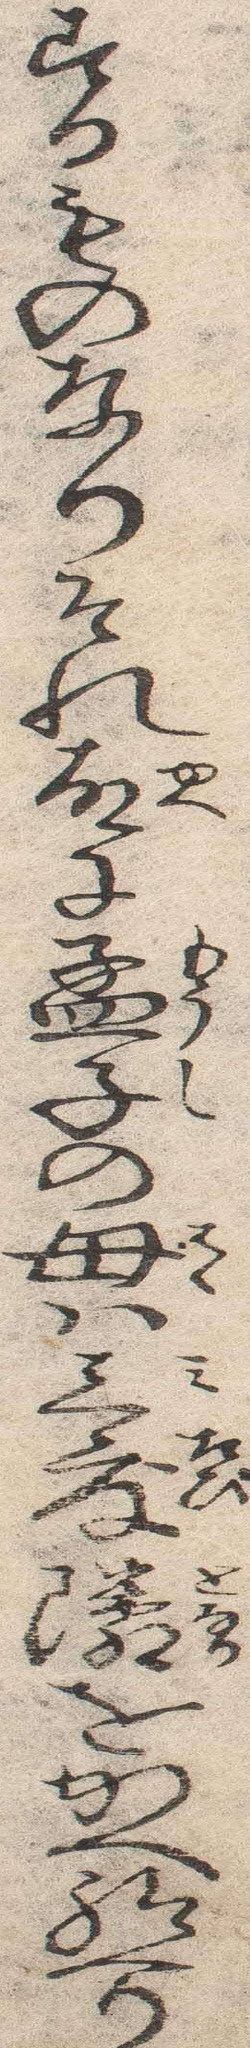するものなりそれ故に孟子の母は三度隣をかへ給へり
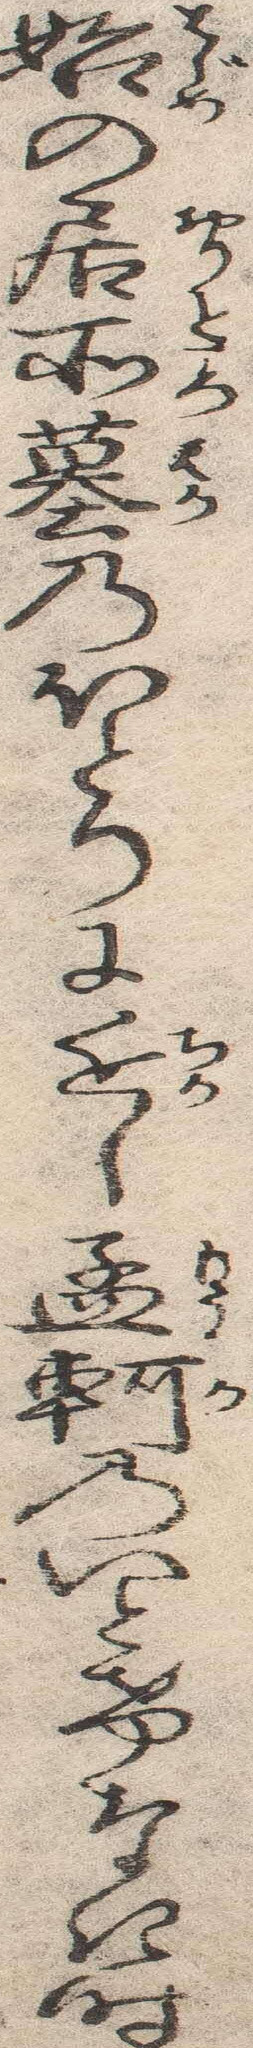始の居所墓のほとりに近し孟軻のいとけなき時
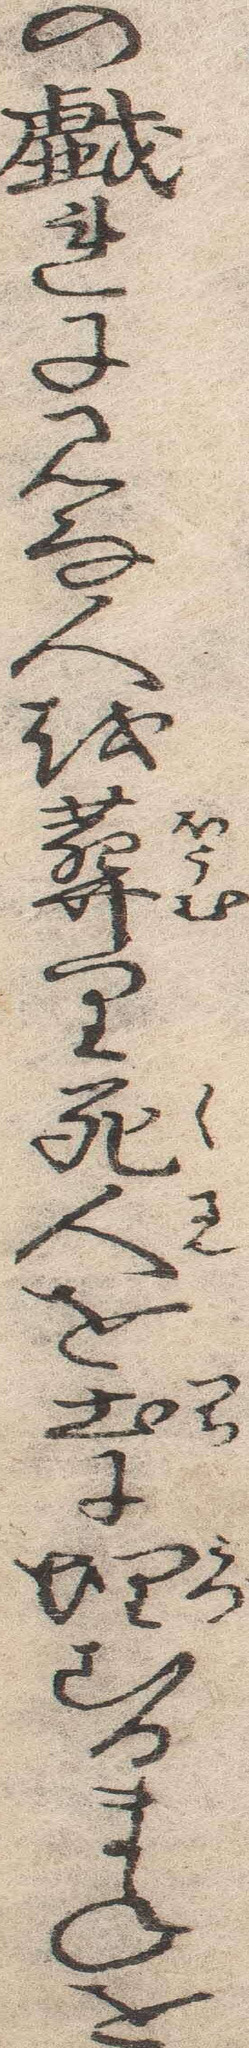の戯れにみな人を葬り死人を土に埋むるまねを
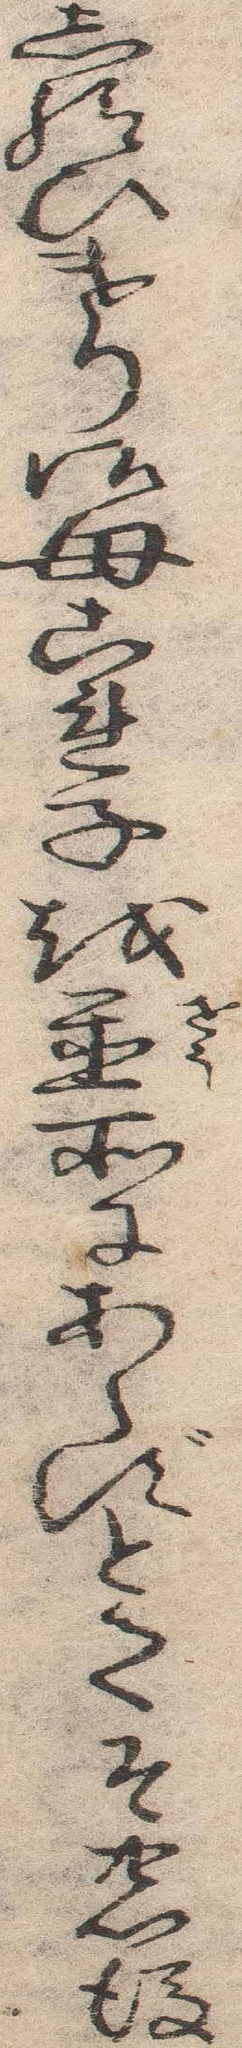し給ひけり御母これ子を置所にあらずとてその後

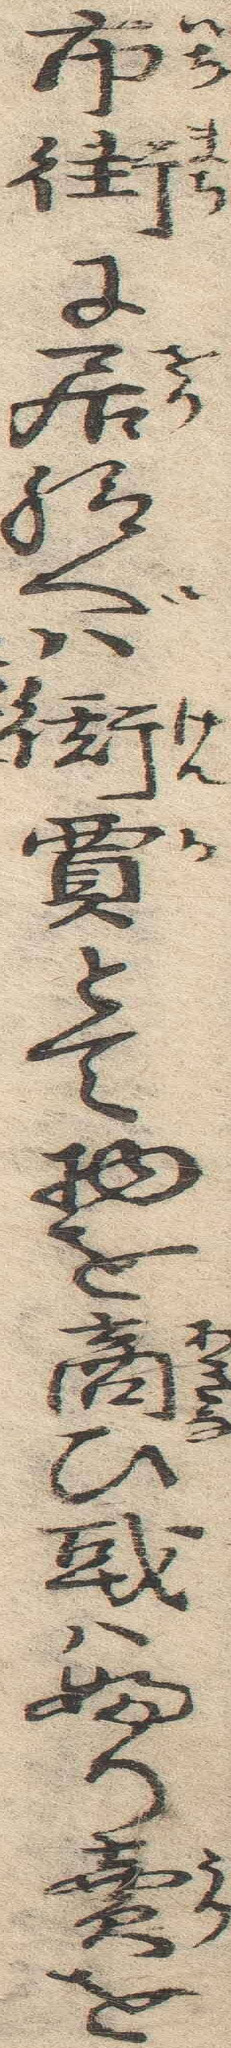市街に居給へば衒賈とて物を商ひ或はふり売を
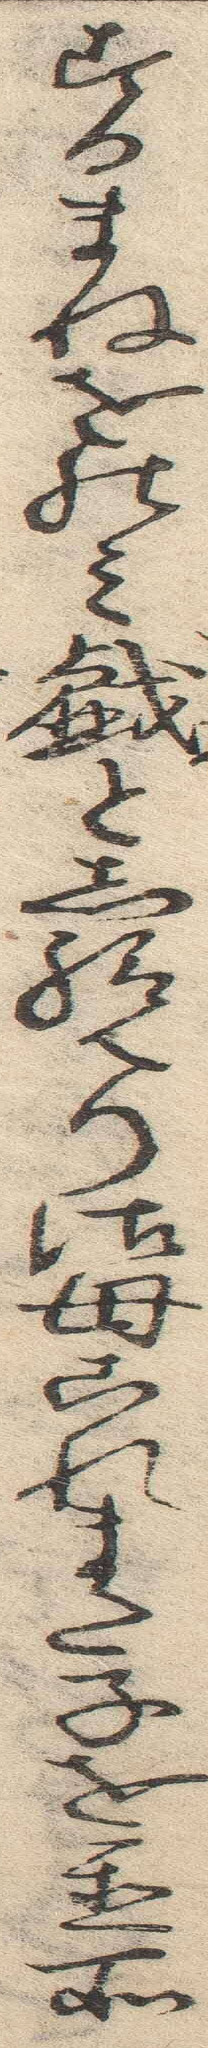するまねをのみ戯とし給えり御母これまた子を置所
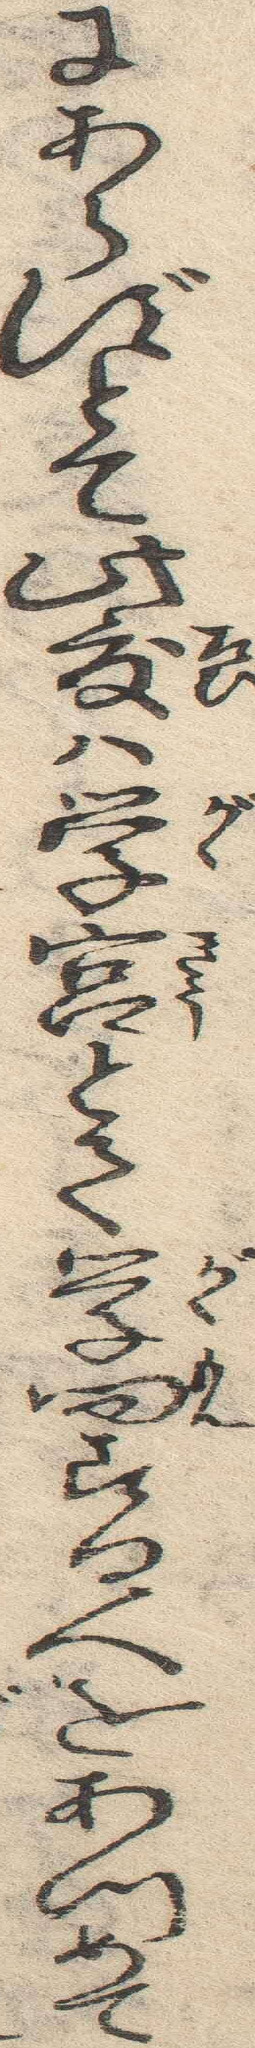にあらずとて此度は学宮とて学問する人をあつめて
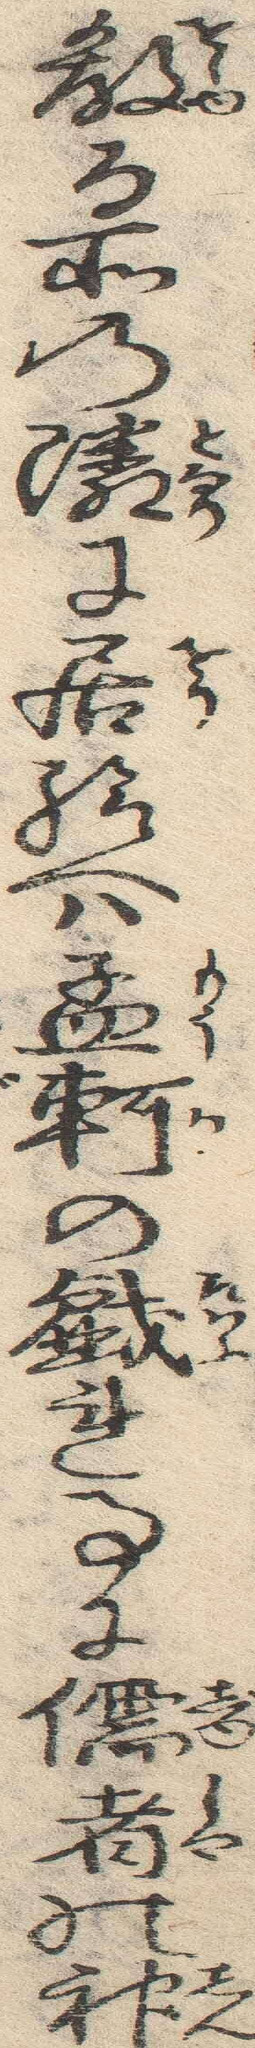教る所の隣に居給へは孟軻の戯れ事に儒者の神
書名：小児必用養育草
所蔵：東京学芸大学附属図書館 国文学研究資料館
